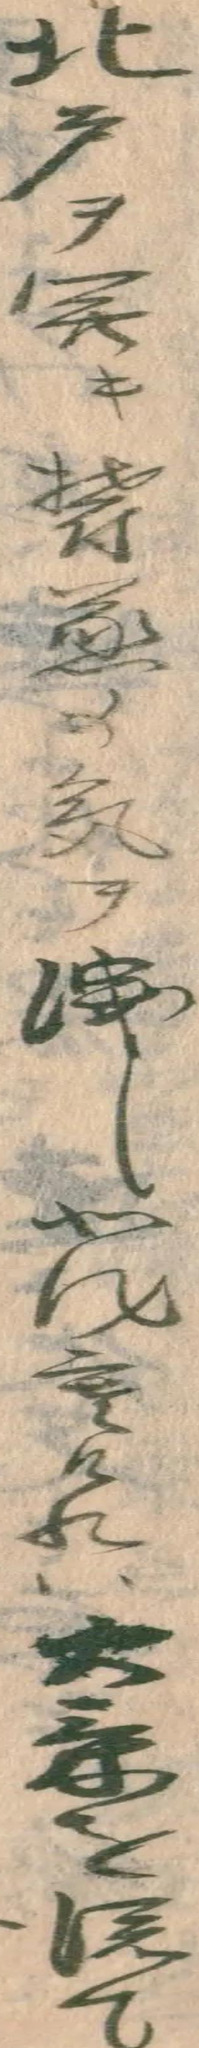北戸ヲ開キ欝蒸の気ヲ洩し北風寒けれは火気を添て
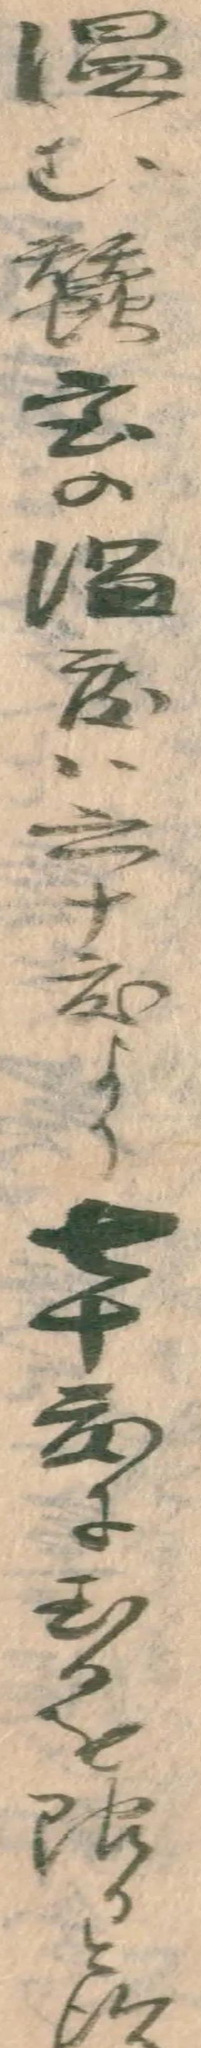温む蚕室の温度ハ六十度より七十度に至るを限りとす
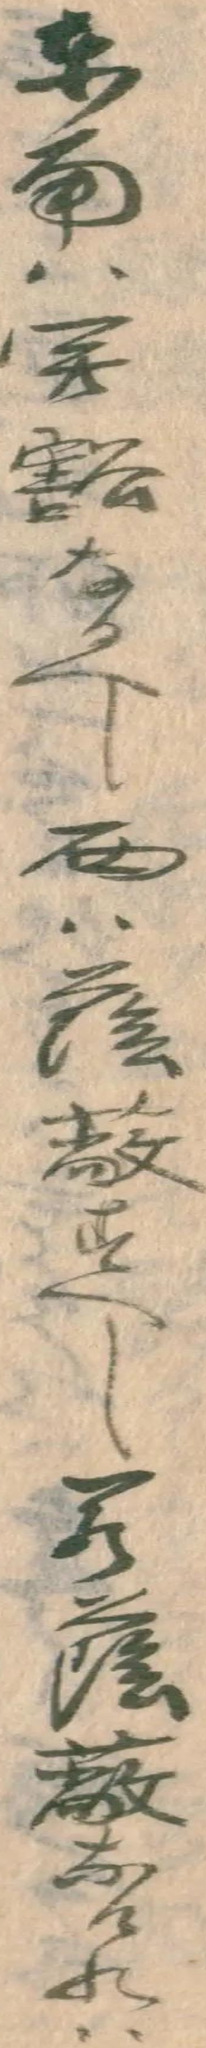東南は開豁なるへし西は蔭蔽すへし若蔭蔽なけれは
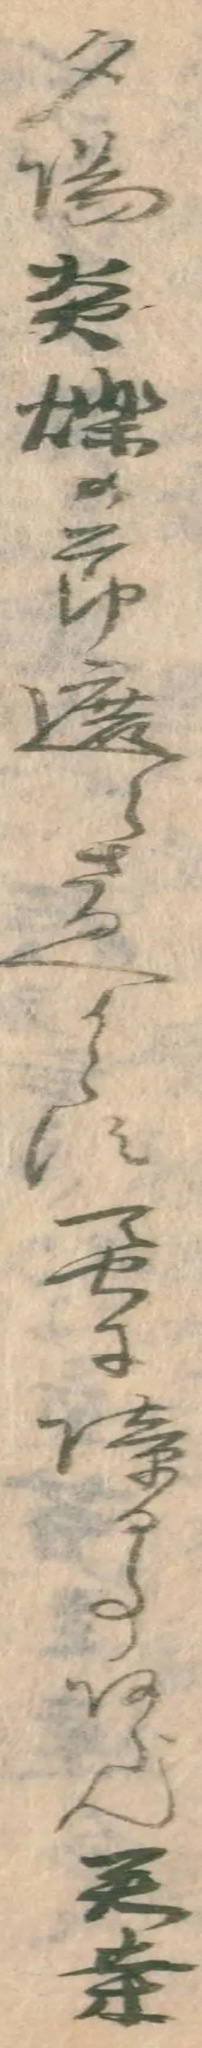夕陽炎爍の節遮らさるへからす蚕に障る事あらん若桑
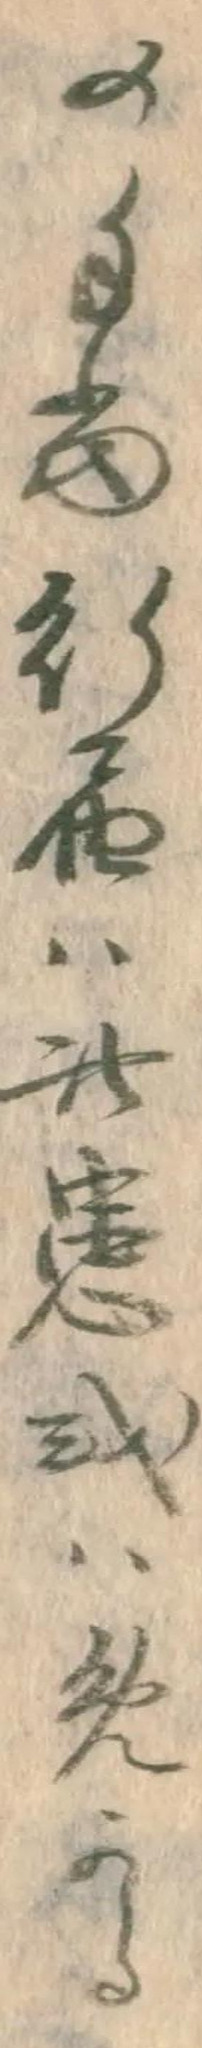の手当行届は此患或ハ免かる
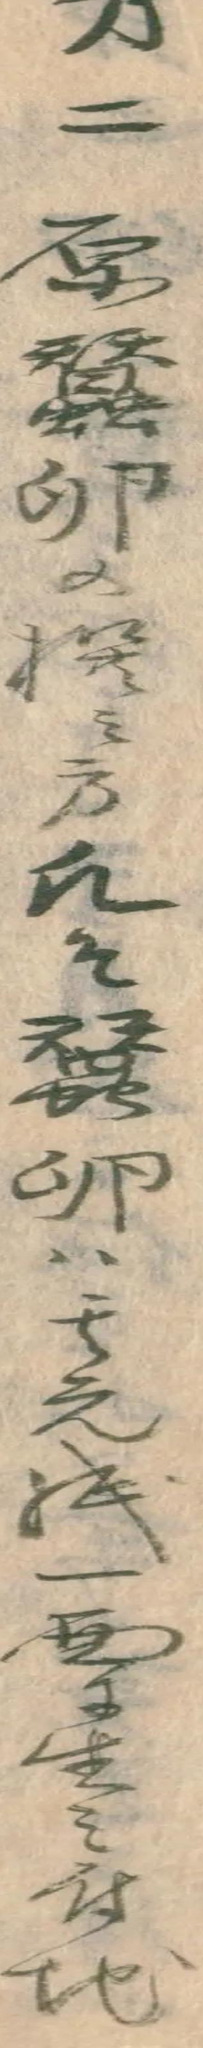第二原蚕卵の撰ミ方凡そ蚕卵ハ其元紙一面に生ミ付地
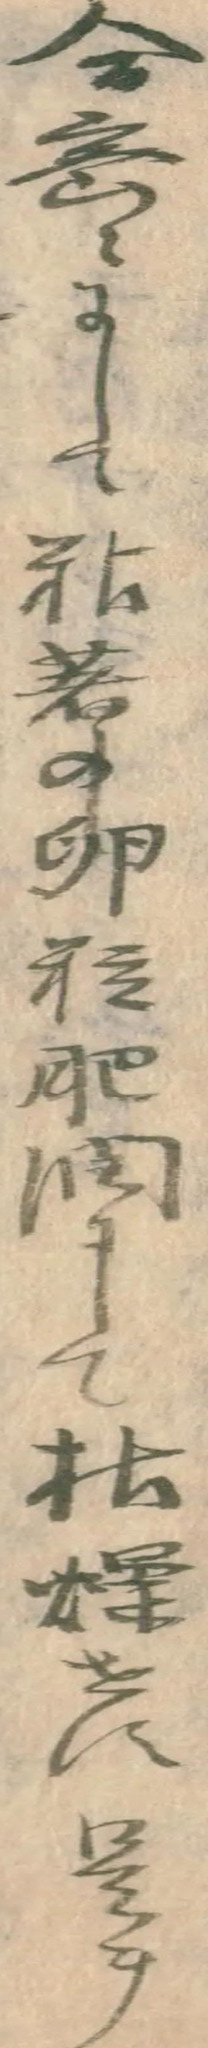合密々にして粘著の卵粒肥潤にして枯燥せす是ヲ
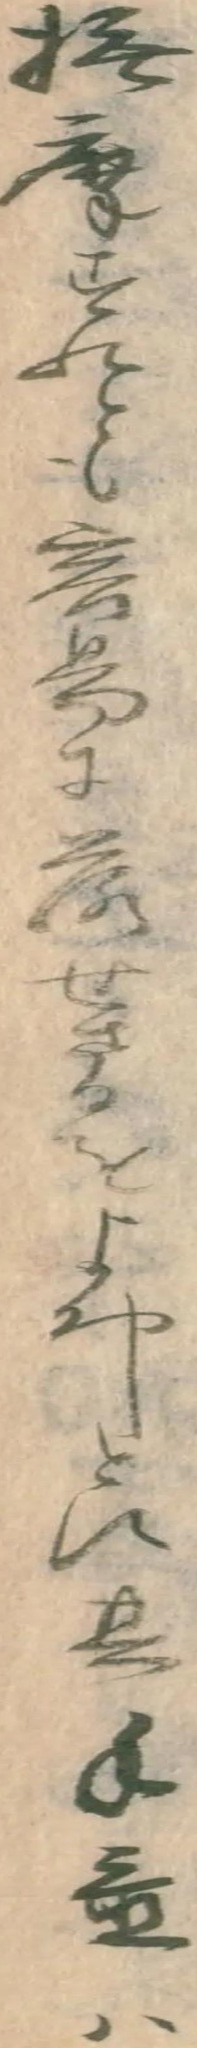撫摩すれとも容易に落せさるをよろしとす其手置ハ

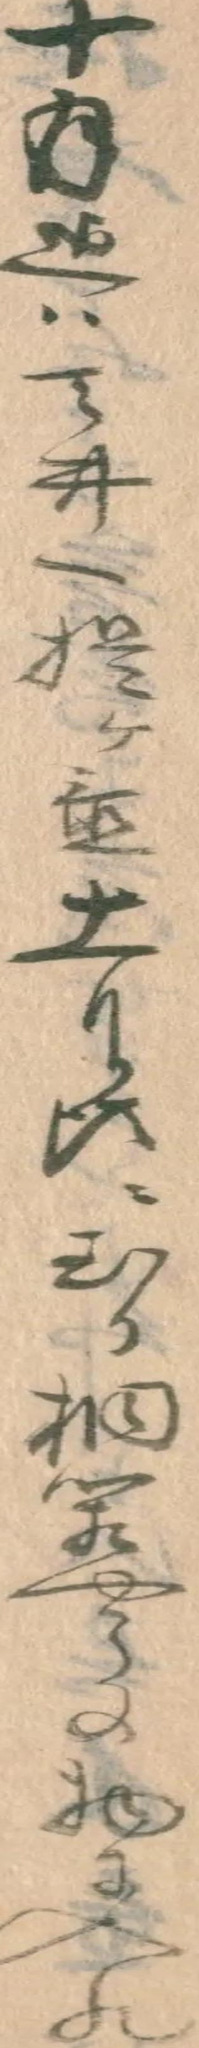十月迄ハ天井へ提ケ置十一月頃ニ至り桐箱やうの物に入れ
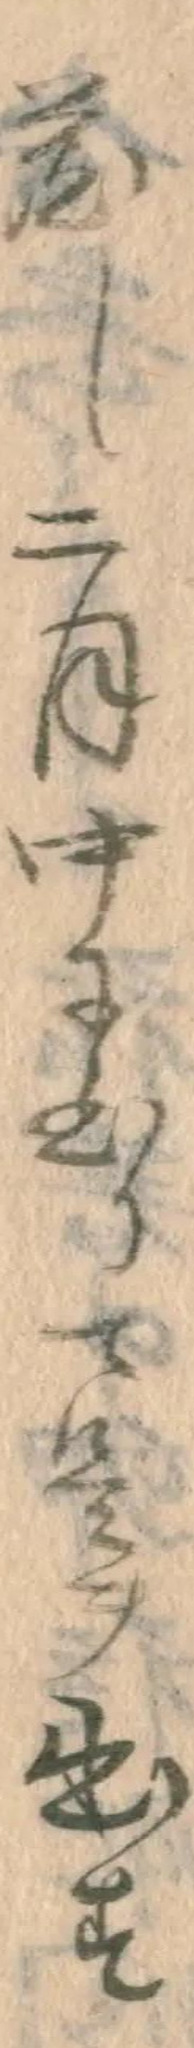蔵し二月中に至りて是を出す
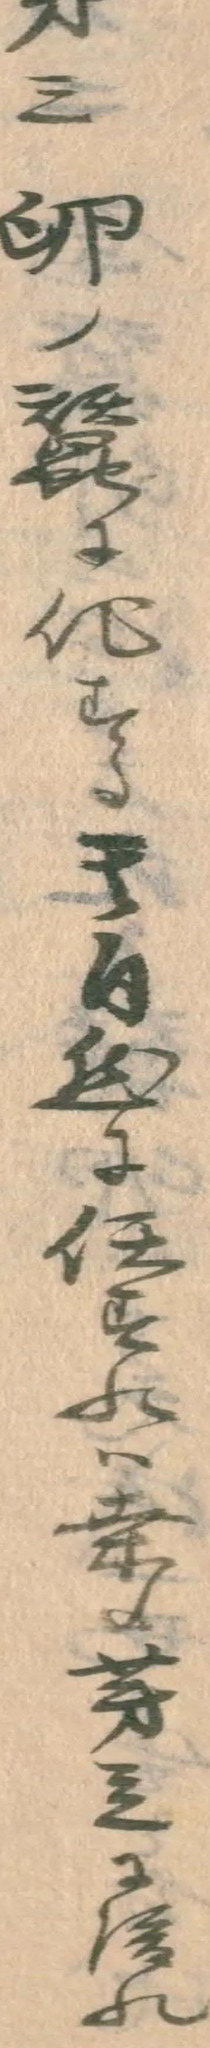第三卵ノ蚕に化する其自然に任すれは桑の芽立に後れ
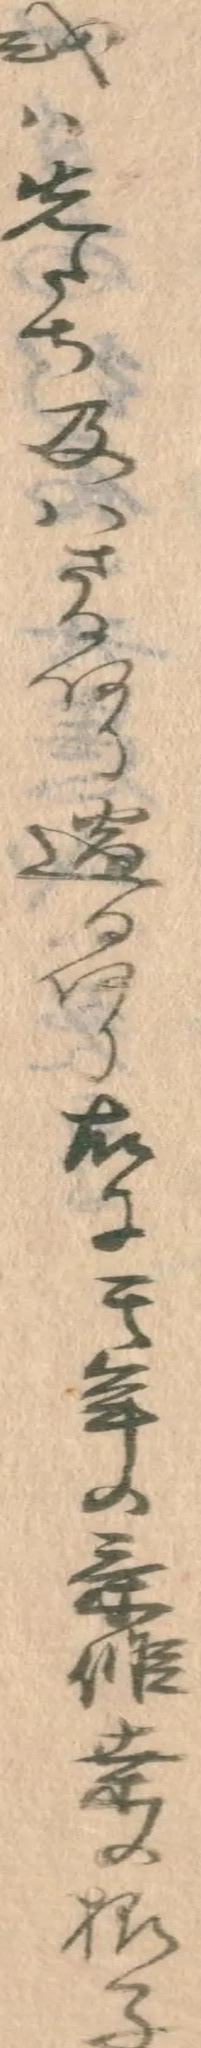或ハ先たち及はさるあり過るあり故に其年の気候桑の様子
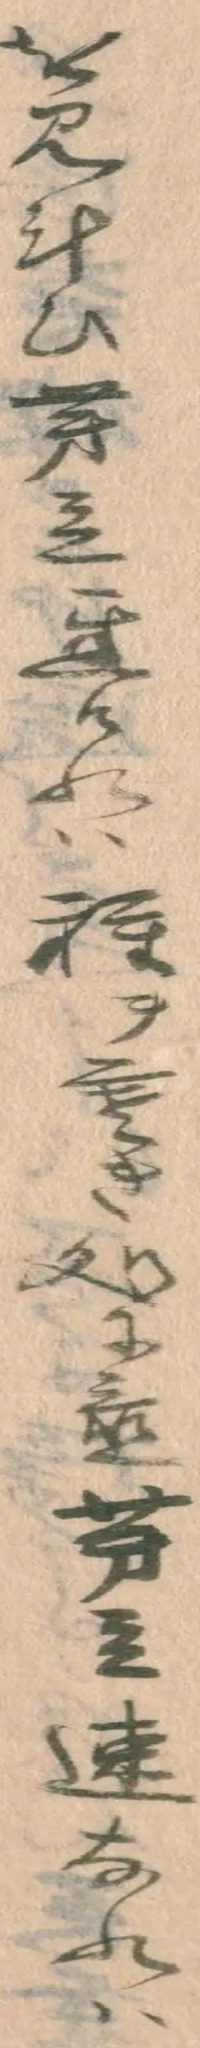を見計ひ芽立遅けれは種ヲ寒き処に置芽立速なれは
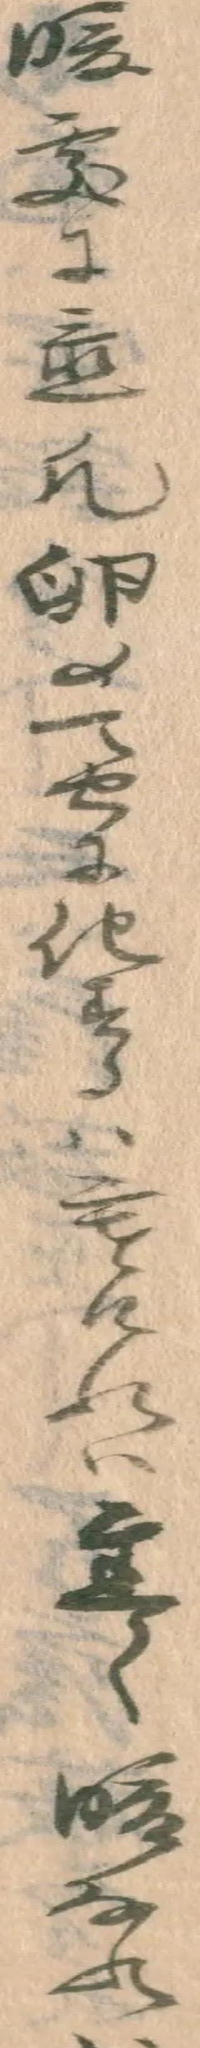暖処に置凡卵の蚕に化するハ寒けれは遅く暖なれは
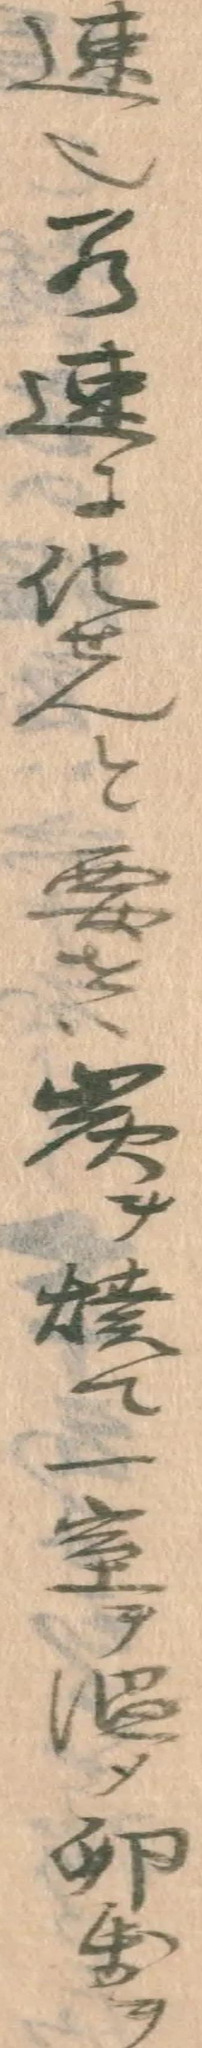速也若速に化せんと要せハ炭ヲ焼て一室ヲ温メ卵紙ヲ
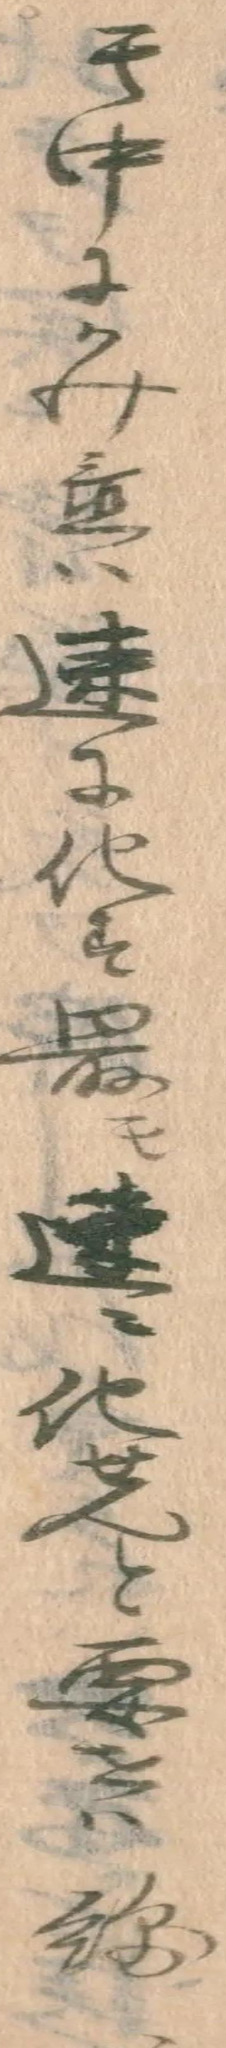其中にかけ置ハ速に化す最も速ニ化せんと要せは綿ニ
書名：蚕桑集成
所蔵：国立国会図書館 National Diet Library, JAPAN
